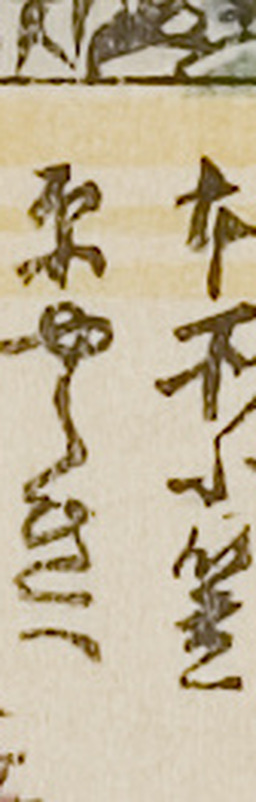原やしきへ
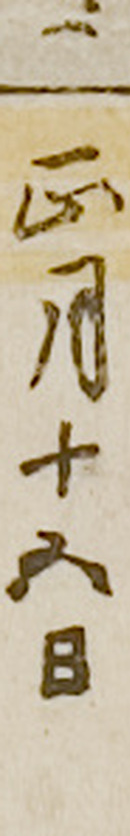正月十五日
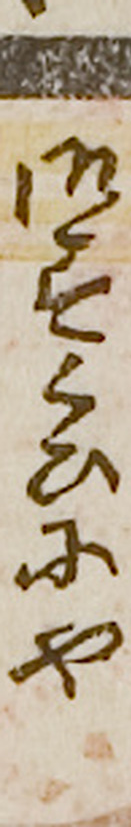御すくひ小や
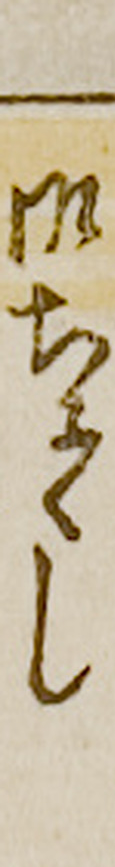御ちょくし
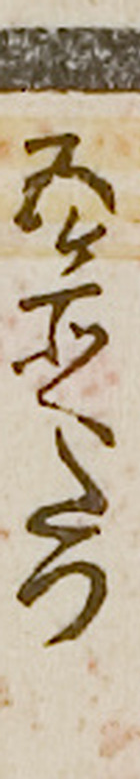五ケ所へたつ
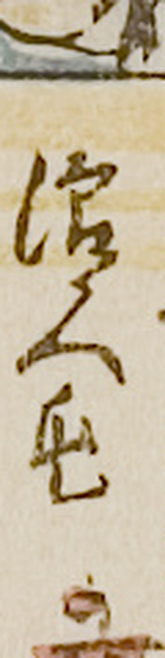浪人屯
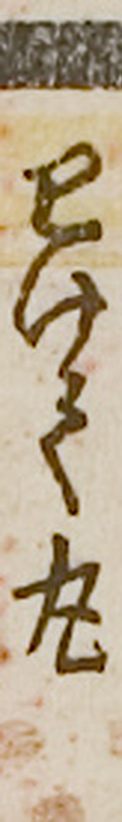わけて丸
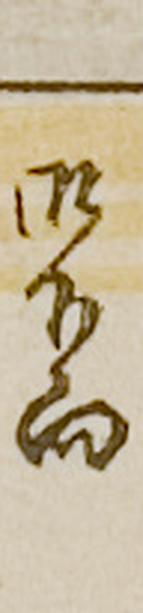御下向
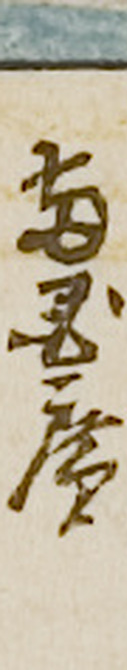両国広
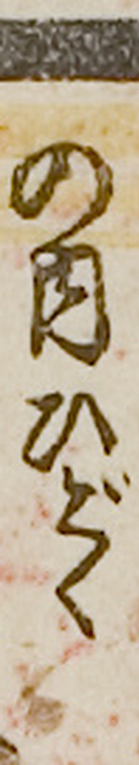の内ひどく
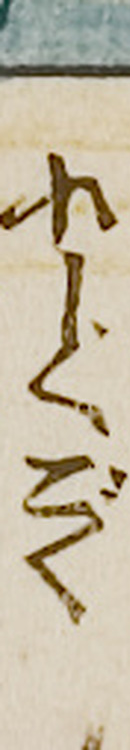小じへごく
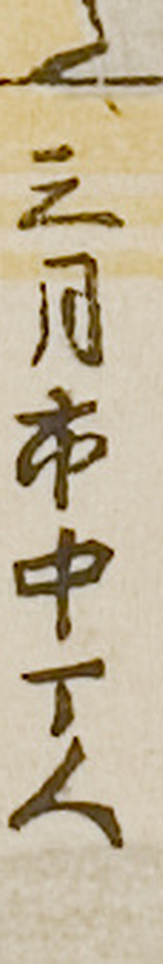三月市中丁人
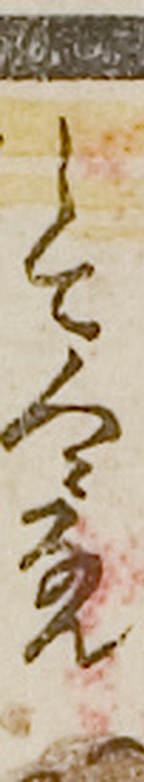して人々なん
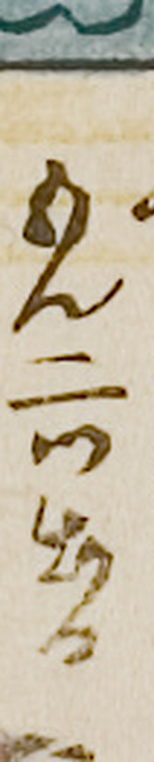もん二ツ出る
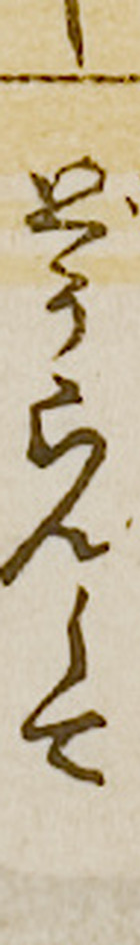どうらんして
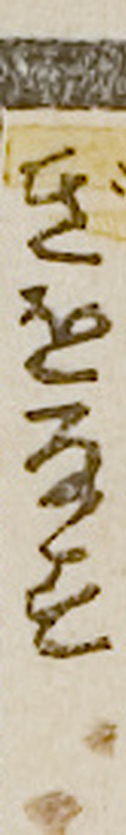ぎをなす
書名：嘉永年間より米相場直段并年代記書抜大新版
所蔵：東京大学総合図書館 General Library in the University of Tokyo, JAPAN
